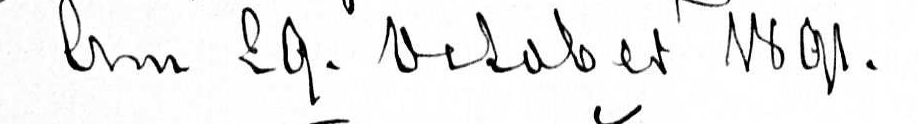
Am 29. October 1891
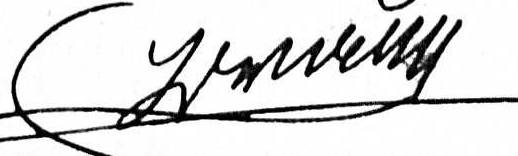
Braun
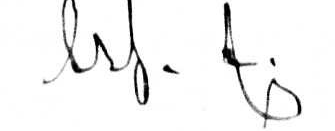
Ah E
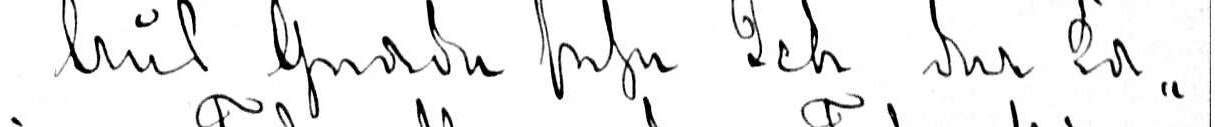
Aus Gnade sehe Ich der Ka¬
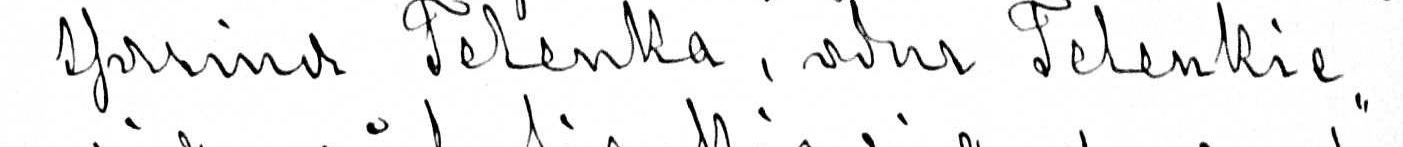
tharina Telenka, oder Telenkie¬
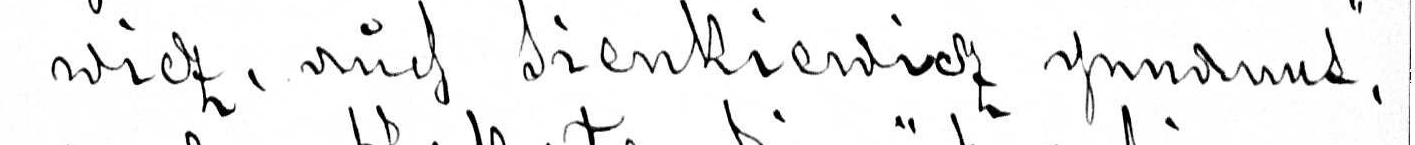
wicz, auch Sienkiewicz genannt,
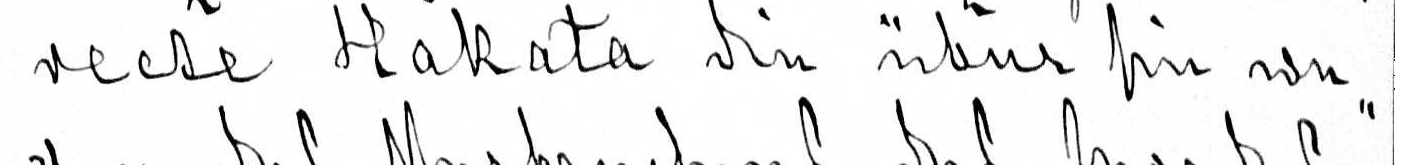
recte Hakała die über sie we¬
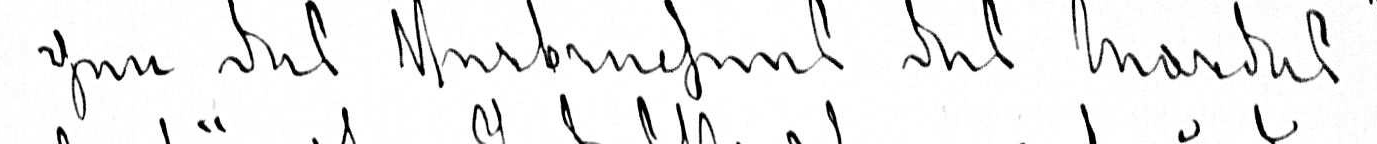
gen des Verbrechens des Mordes
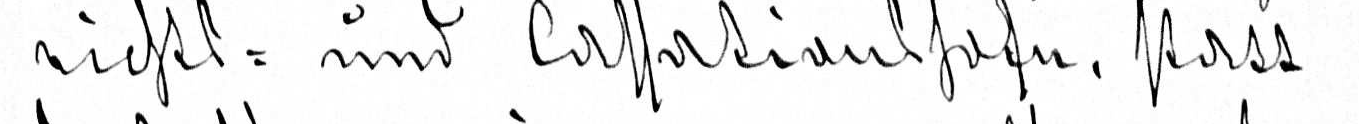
richts- und Cassationshofe, statt
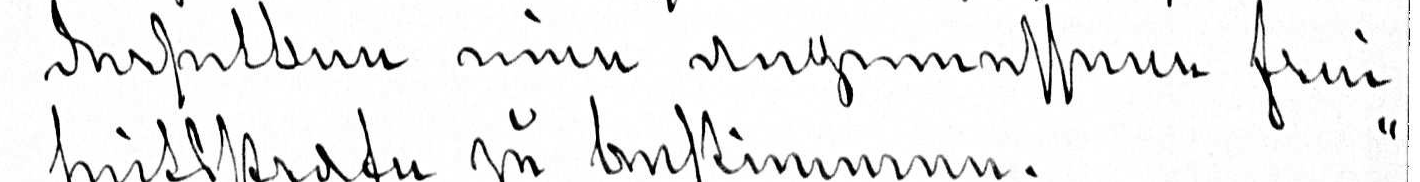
derselben eine angemessene Frei¬
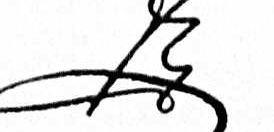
FJ
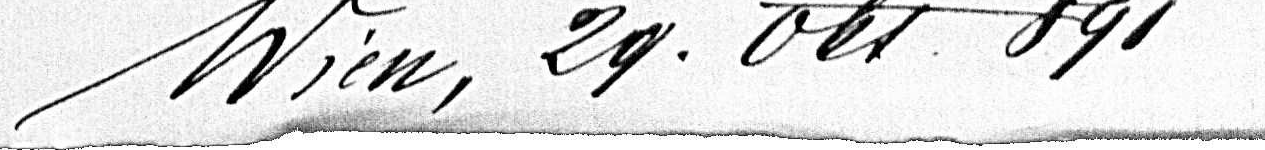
Wien, 29. Oct. 1891
